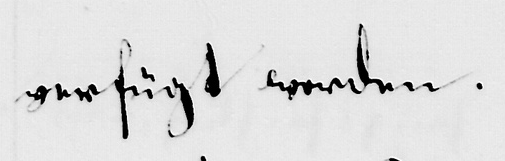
verfügt werden.
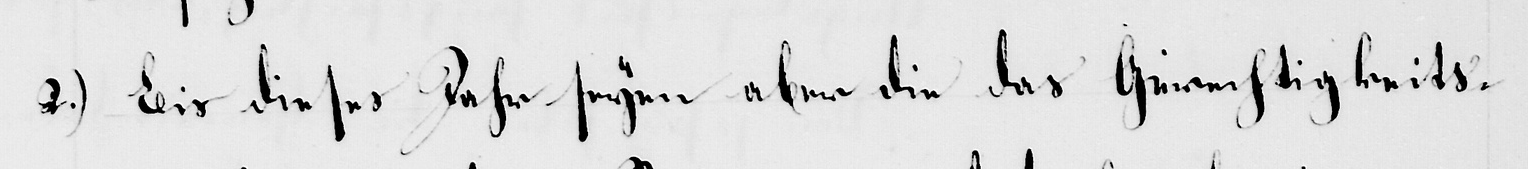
2.) Bis dieses Jahr seyen aber die das Gerechtigkeits¬
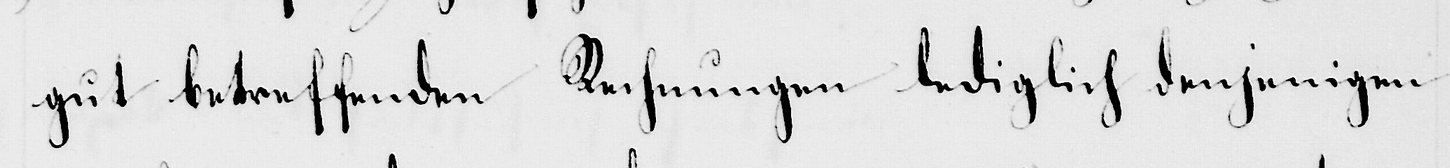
gut betreffenden Rechnungen lediglich denjenigen
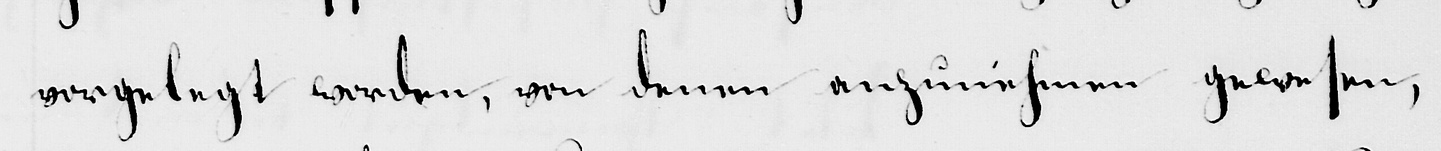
vorgelegt worden, von denen anzunehmen gewesen,
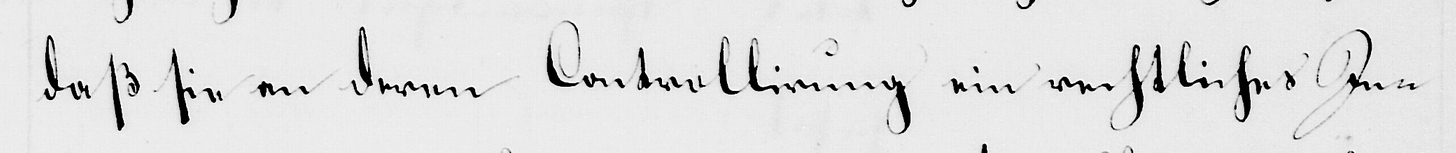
daß sie an deren Controllirung ein rechtliches In¬
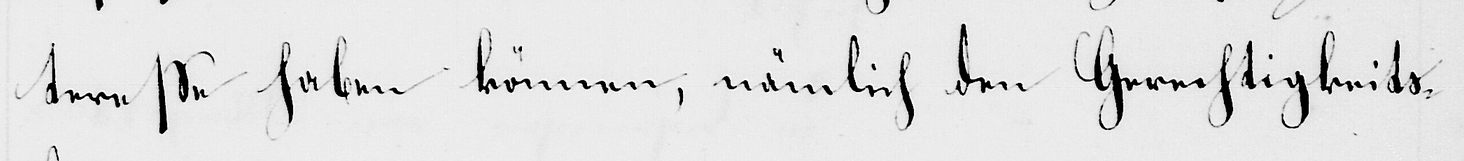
tereße haben können, nämlich den Gerechtigkeits¬
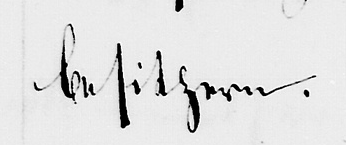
besitzern.
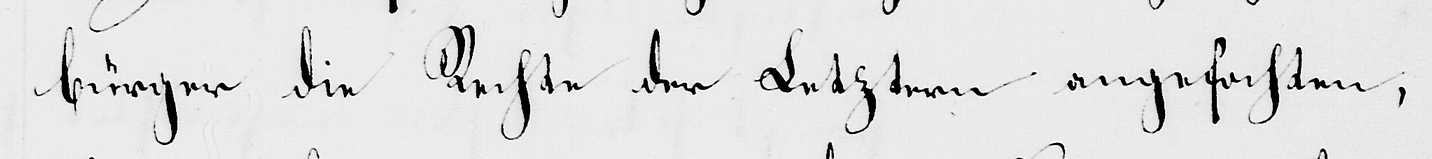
bürger die Rechte der Letztern angefochten,
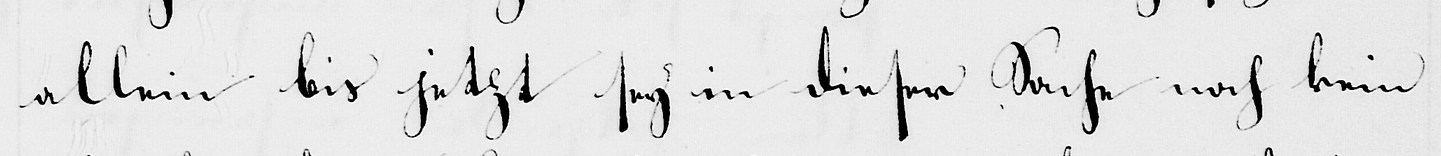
allein bis jetzt sey in dieser Sache noch kein
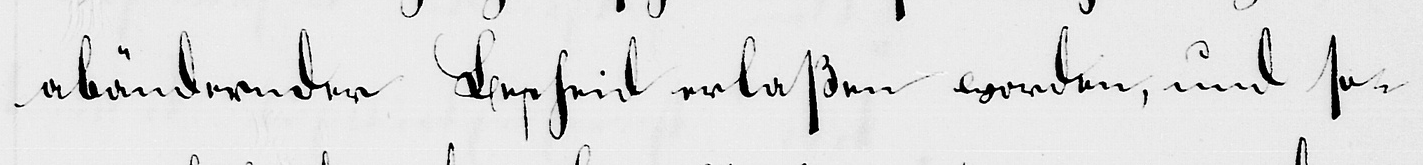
abändernder Bescheid erlaßen worden, und so¬
